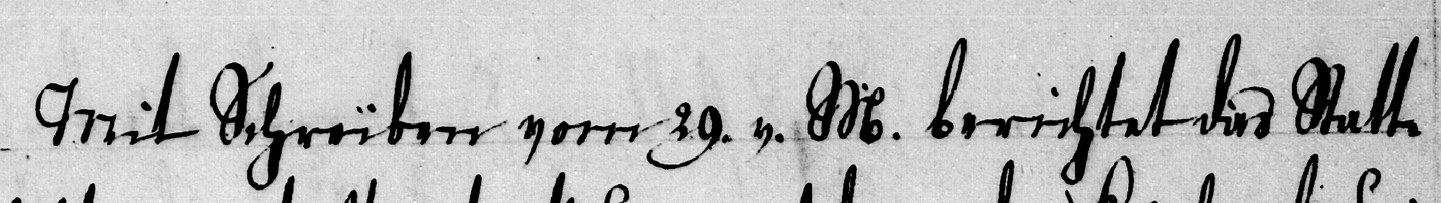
Mit Schreiben vom 29. v. M. berichtet das Statt¬
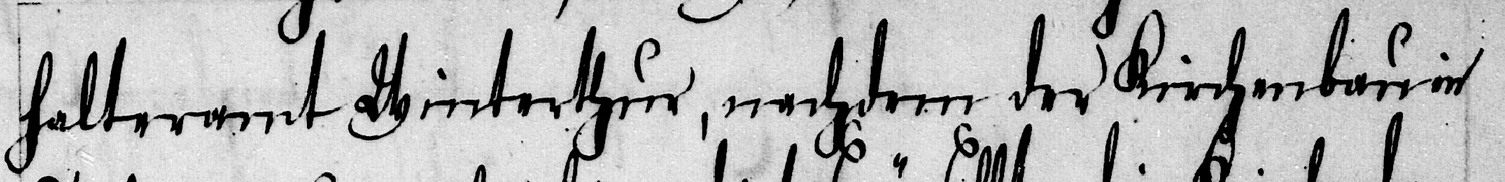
halteramt Winterthur, nachdem der Kirchenbau
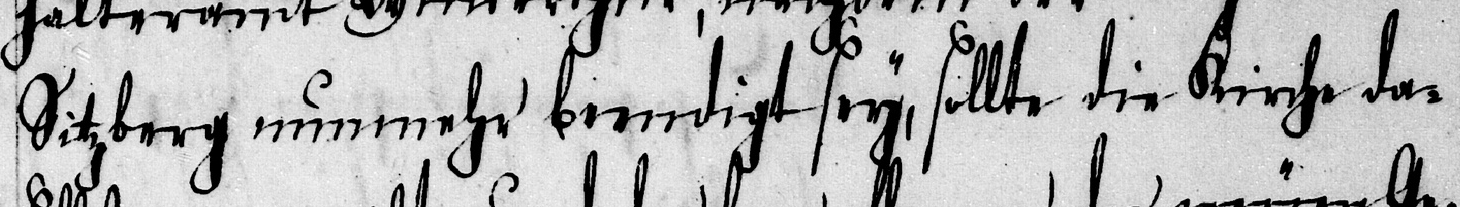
Sitzberg nunmehr beendigt sey, sollte die Kirche da¬
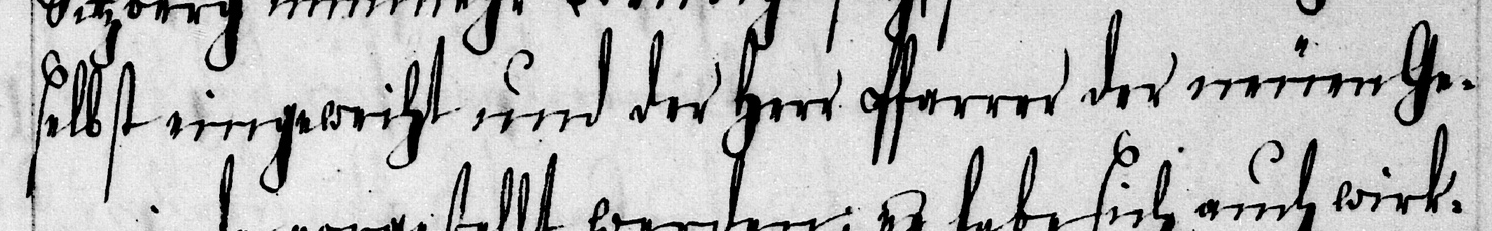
selbst eingeweiht und der Herr Pfarrer der neuen Ge¬
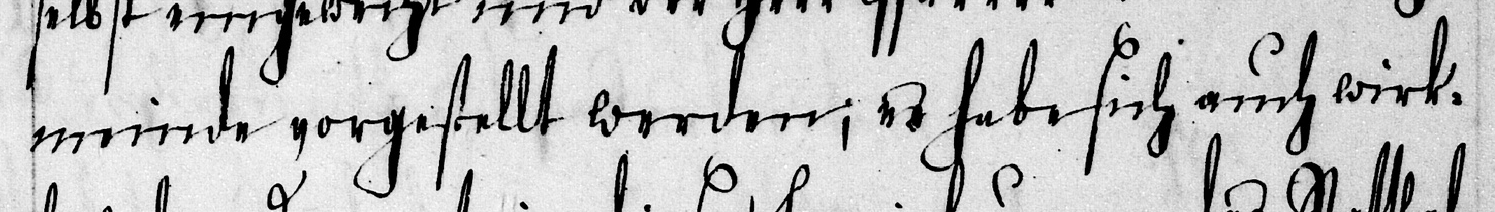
meinde vorgestellt werden; es habe sich auch wirk¬
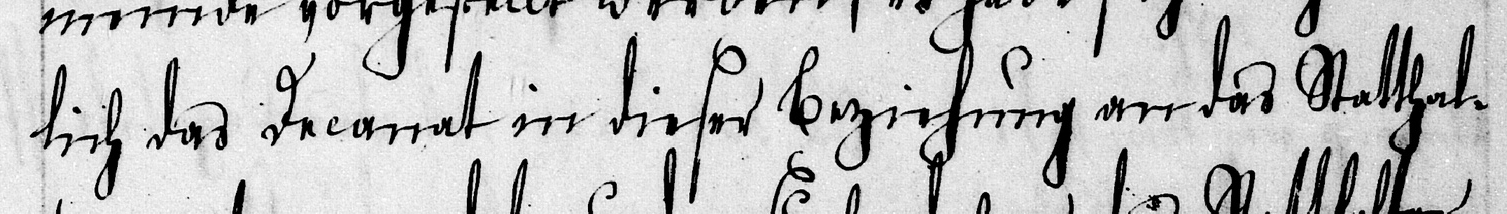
lich das Decanat in dieser Beziehung an das Statthal¬
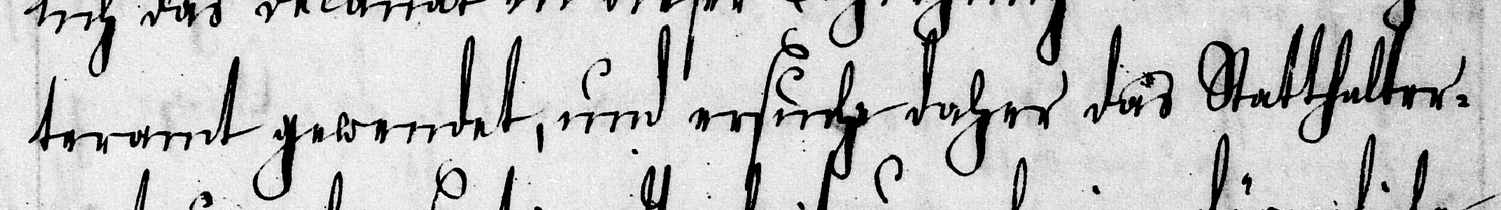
teramt gewendet, und ersuche daher das Statthalter¬
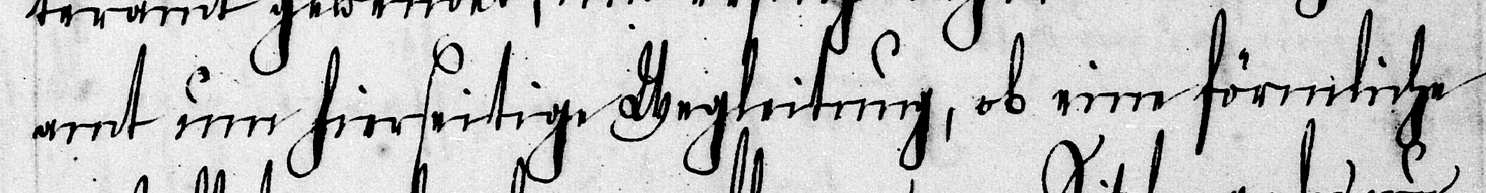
amt um hierseitige Wegleitung, ob eine förmliche
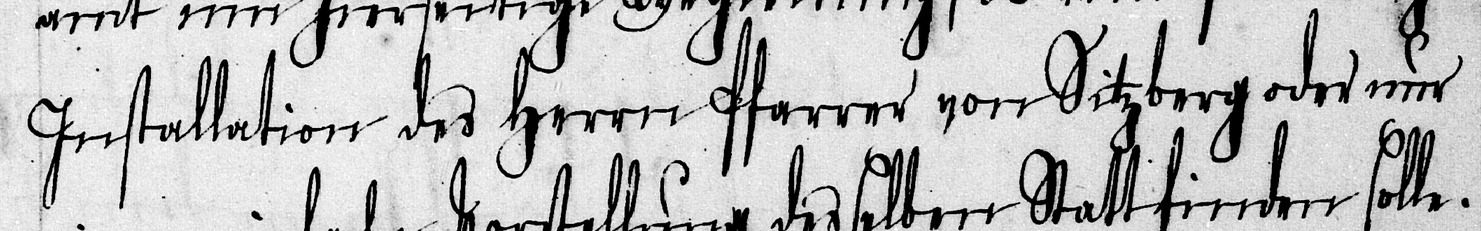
Installation des Herrn Pfarrer von Sitzberg oder nur
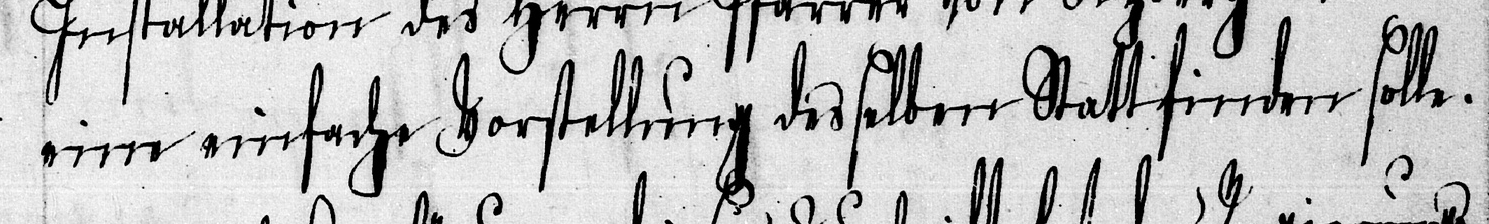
eine einfache Vorstellung desselben Statt finden sol¬
